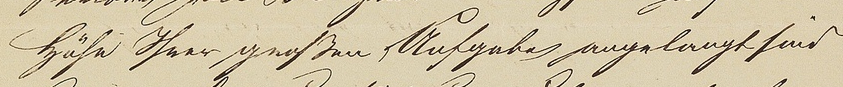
Höhe Ihrer großen Aufgabe angelangt sind
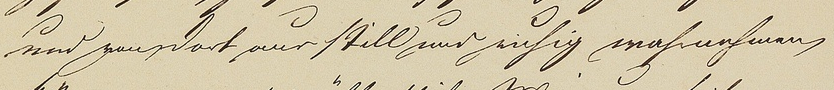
und von dort aus still und ruhig wahrnehmen
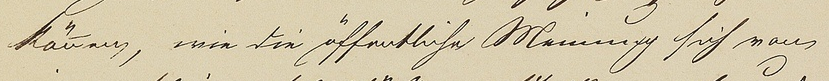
können, wie die öffentliche Meinung sich von
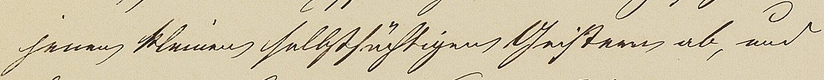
jenen kleinen selbstsüchtigen Geistern ab, und
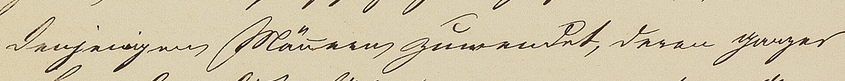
denjenigen Männern zuwendet, deren ganzes
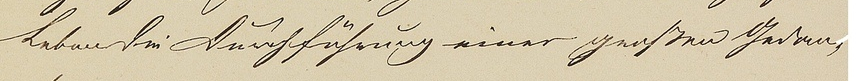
Leben die Durchführung eines großen Gedan-
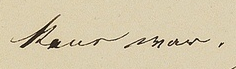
kens war.
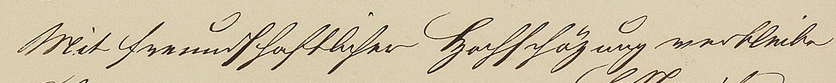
Mit freundschaftlicher Hochschäzung verbleibe
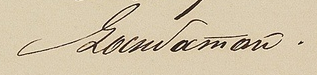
Landammann.
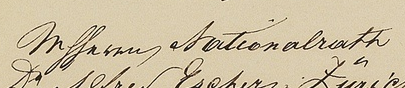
Mhherrn Nationalrath
